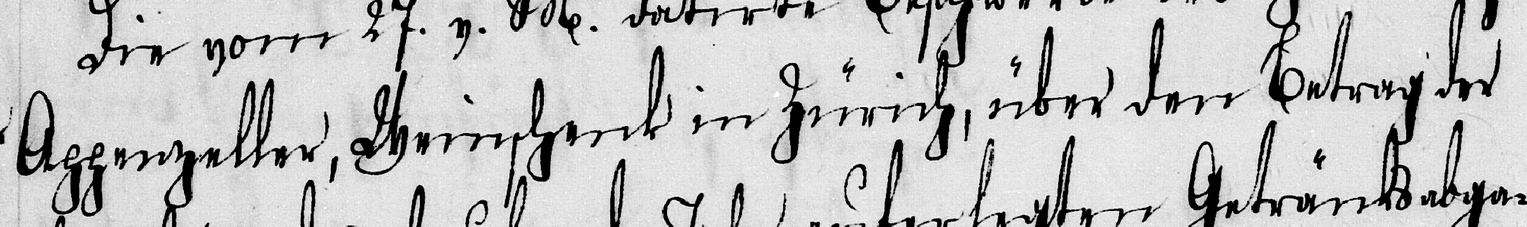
Appenzeller, Weinschenk in Zürich, über den Betrag der
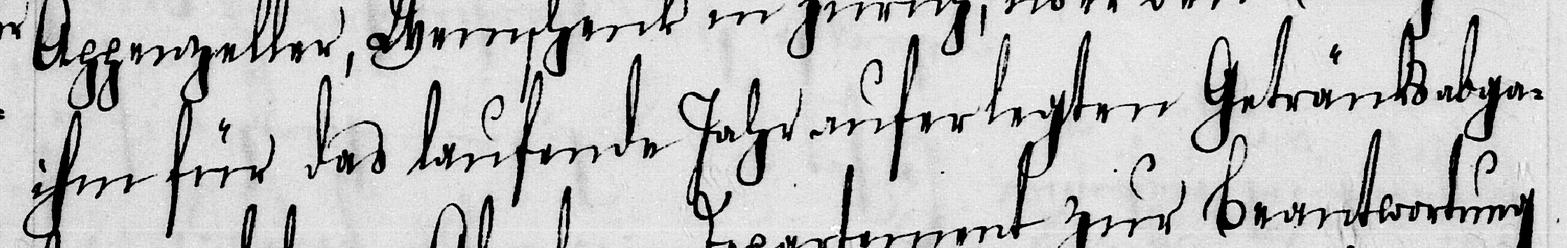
ihm für das laufende Jahr auferlegten Getränksabga¬
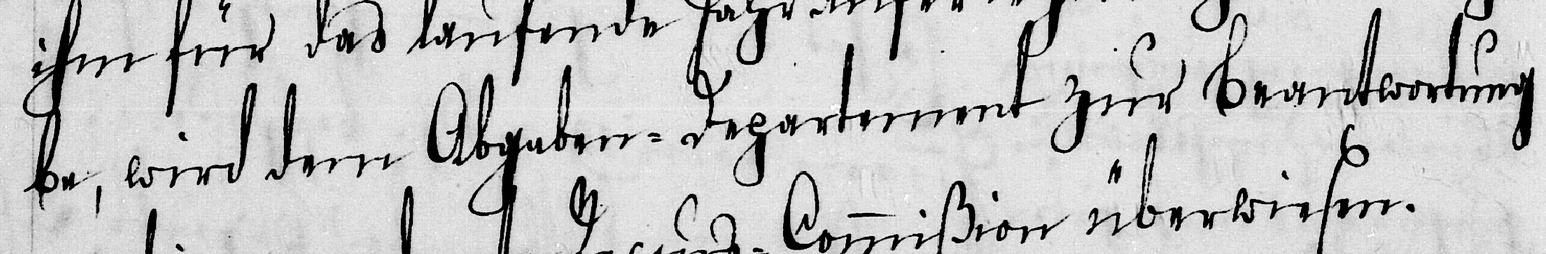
be, wird dem Abgaben-Departement zur Beantwortung
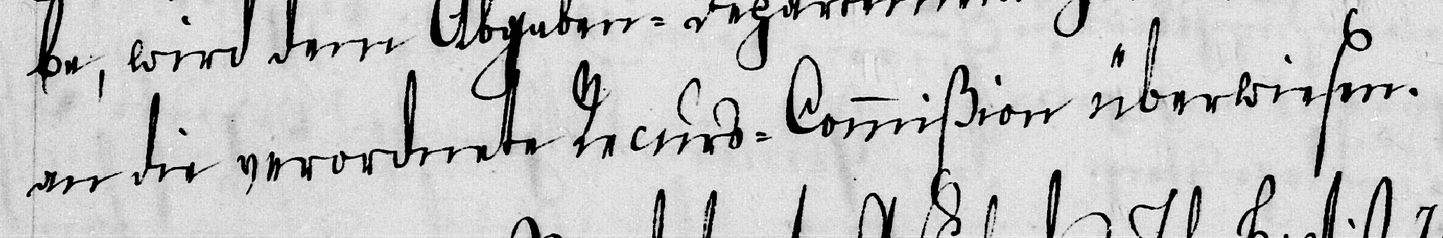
an die verordnete Recurs-Commißion überwiesen.
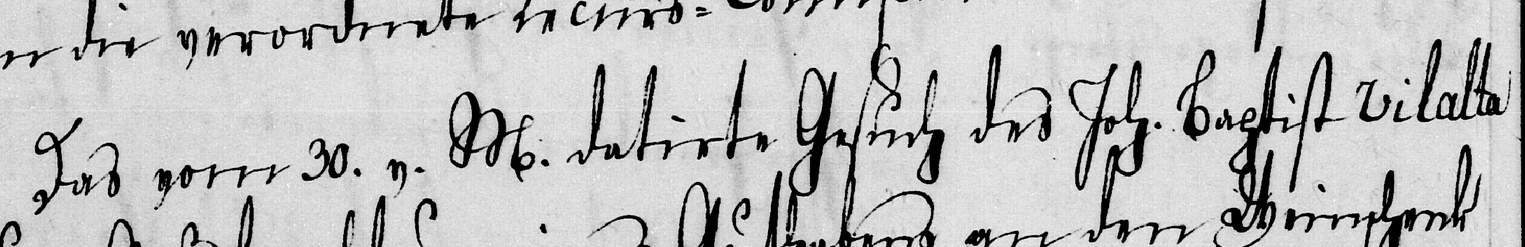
Das vom 30. v. M. datirte Gesuch des Joh. Baptist Vilalta
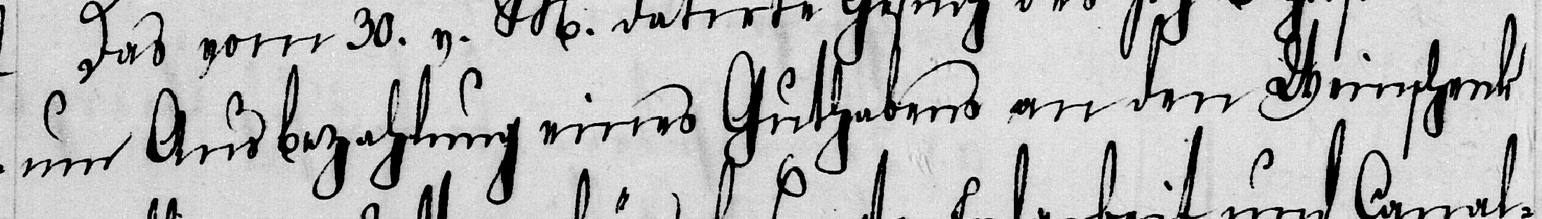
um Ausbezahlung eines Guthabens an den Weinschenk
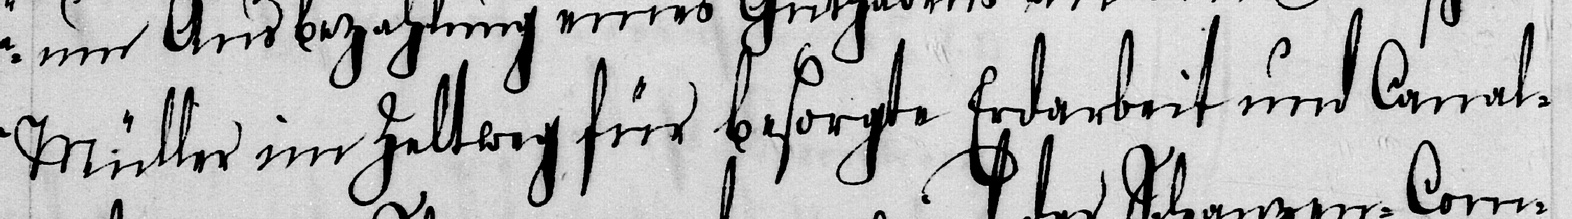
Müller im Zeltweg für besorgte Erdarbeit und Canal¬
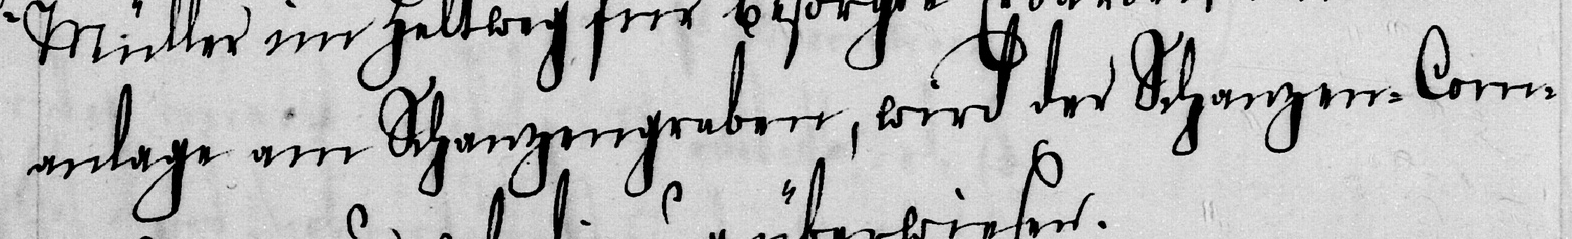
anlage am Schanzengraben, wird der Schanzen-Com¬
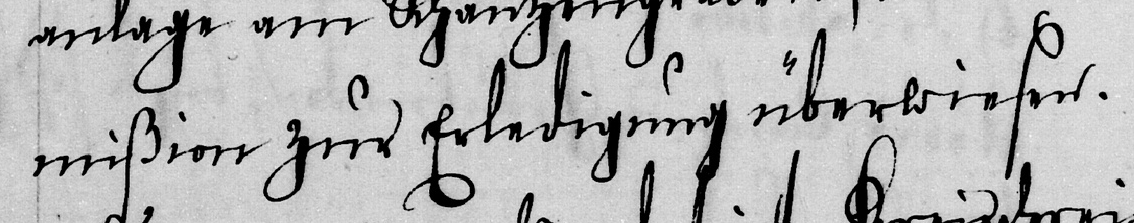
mißion zur Erledigung überwiesen.
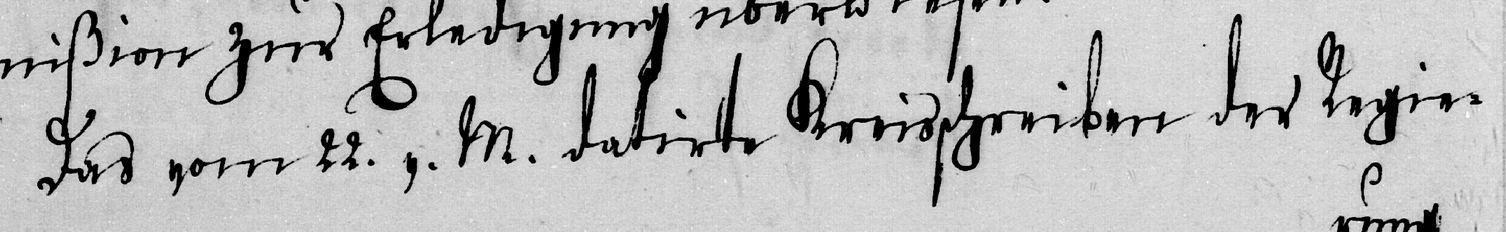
Das vom 22. v. M. datirte Kreisschreiben der Regie-
